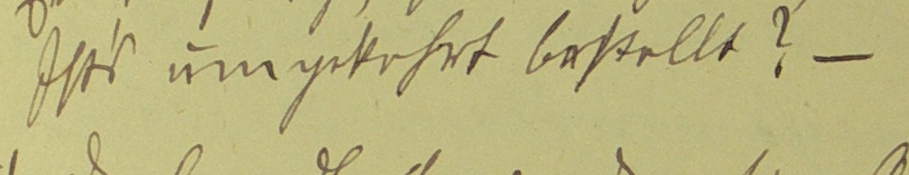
Ist‘s umgekehrt bestellt ?
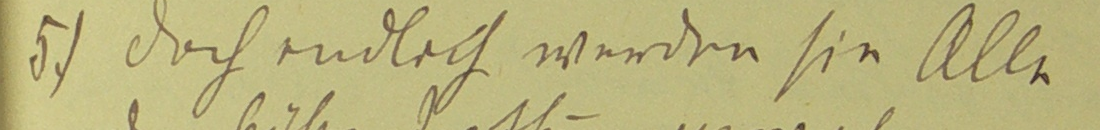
5) Doch endlich werden sie Alle
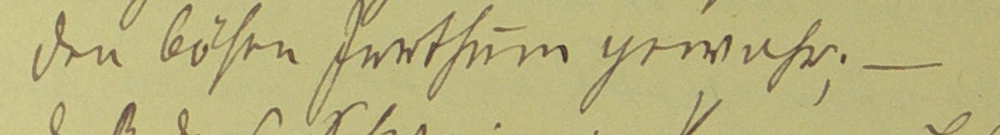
Den bösen Irrthum gewahr.-
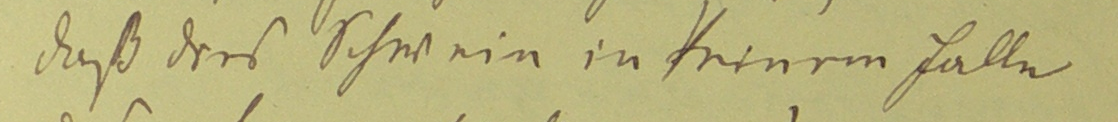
Daß dies Schwein in keinem Falle
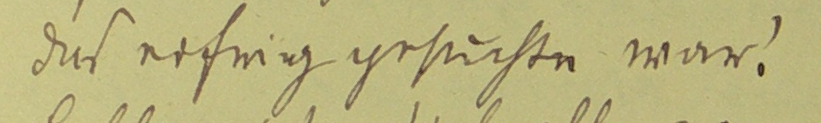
Das eifrig gekaufte war !.
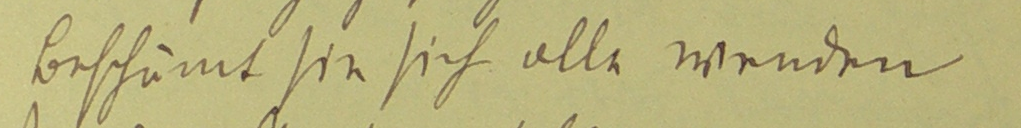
Beschämt sie sich alle wenden
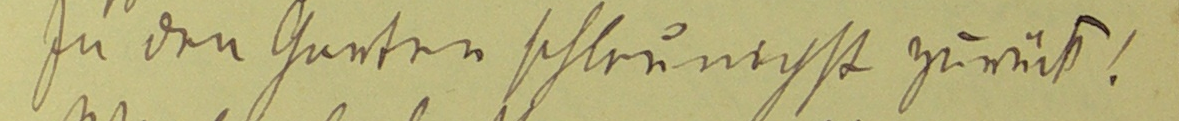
In den Garten schleunigst zurück
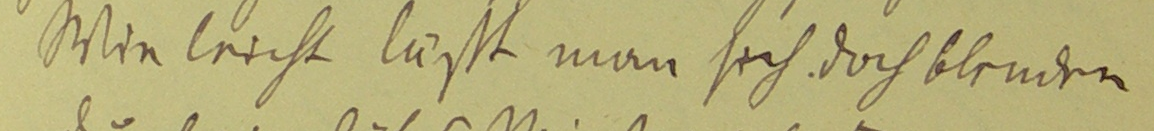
Wie leicht läßt man sich doch blenden
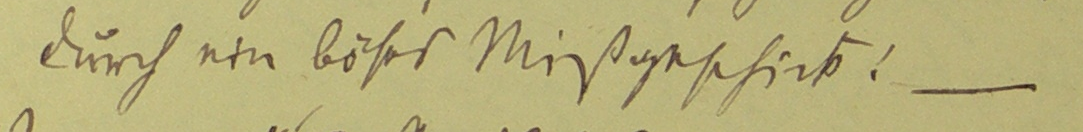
Durch ein böses Mißgeschick.
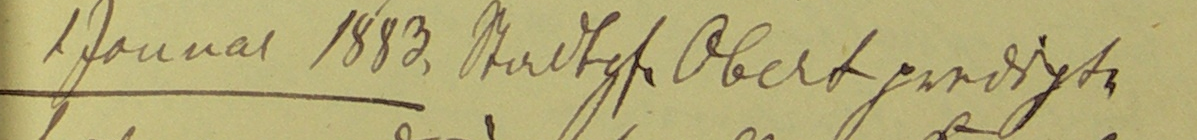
1Januar 1883 Stadtpfarrer Obert predigte
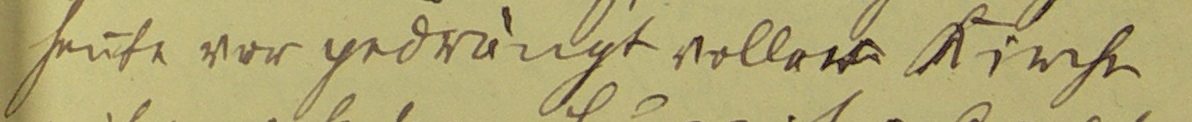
heute vor gedrängt voller Kirche
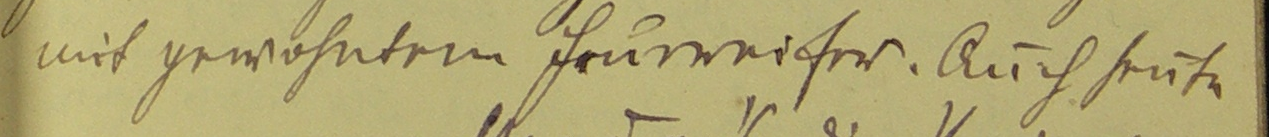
mit gewohnten Feuereifer. Auch heute
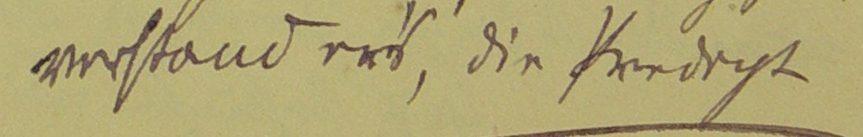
verstand er´s die Predigt
